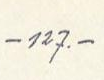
127-
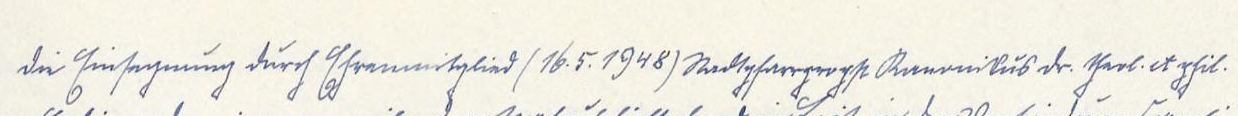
die Einsegnung durch Ehrenmitglied (16. 5. 1948) am Stadtpfarrpropst Kanonikus Dr. theol. et phil.
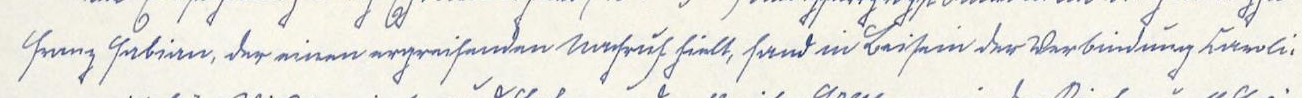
Franz Fabian, der einen ergreifenden Nachruf hielt, fand in Beisein der Verbindung Caroli-
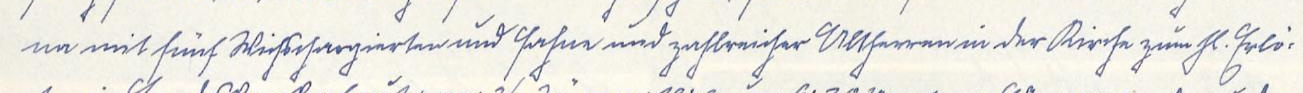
na mit fünf Wichschargierten und Fahne und zahlreicher Altherren in der Kirche zum hl. Erlö-
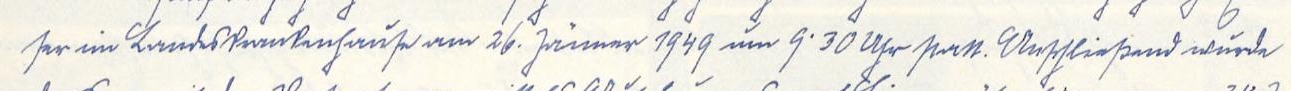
ser im Landeskrankenhause am 26. Jänner 1949 nun 9.30 Uhr statt. Auschließend wurde
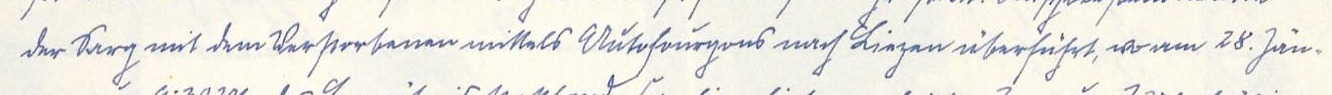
der Sarg mit dem Verstorbenen mittels Autofourgons nach Liezen überführt, wo am 28. Jän-
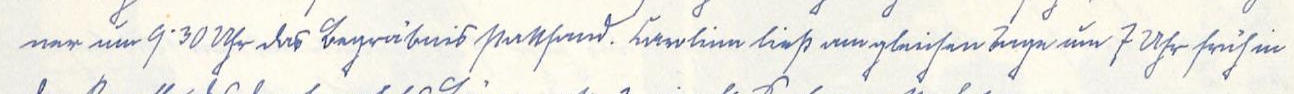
ner um 9.30 Uhr das Begräbnis stattfand. Carolina ließ am gleichen Tage um 7 Uhr früh in
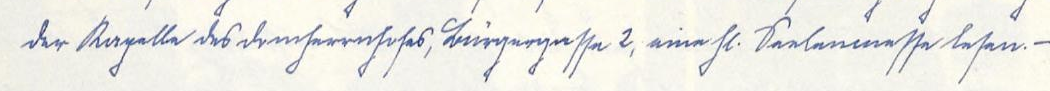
der Kapelle des Domherrenhofes, Bürgergasse 2, eine hl. Seelenmesse lesen.
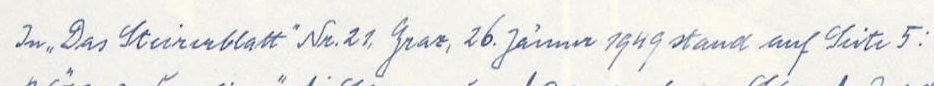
In "Das Steirerbatt"“ Nr. 21 Graz, 26. Jänner 1949 stand auf Seite 5:
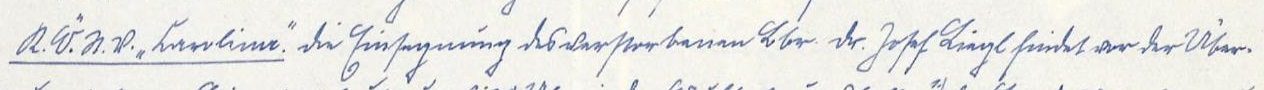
K. Ö. St. V „Carolina". Die Einsegnung des verstorbenen Bbr Dr. Josef Liegl findet vor der Über-
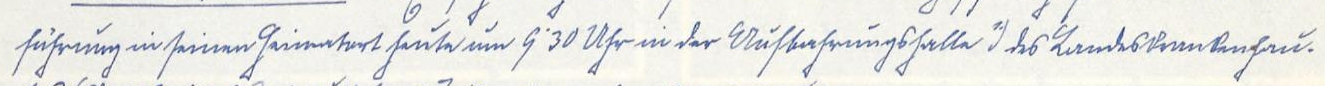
führung in seinen Heimtort heute um 9.30 Uhr in der Aufbahrungshalle 3) der Landeskrankenhau-
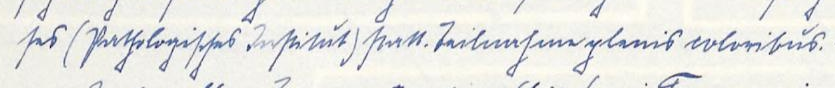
es (Pathologisches Institut) statt. Teilnahme plenis coloribus.
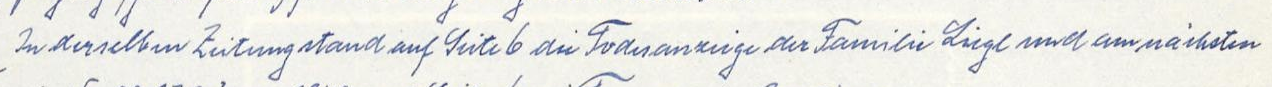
In derselben Zeitung stand auf Seite 6 die Todesanzeige der Familie Liegl und am nächsten
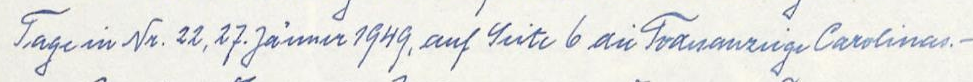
Tage in Nr. 22., 7. Jänner 1949, auf Seite 6 die Traueranzeige Carolinas.
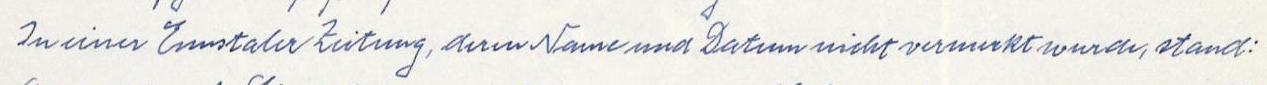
In einer Ennstaler Zeitung, deren Name und Datum nicht vermerkt wurde, stand:
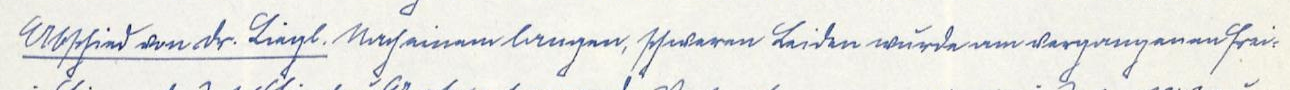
Abschied von Dr. Liegl. Nach einem langen, schweren Leiden wurde an vergangenen Frei-
